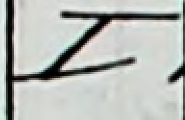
I
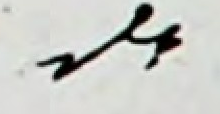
Do
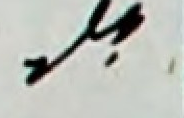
Do
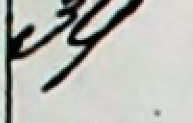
39
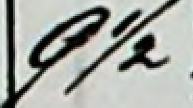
9 1/2
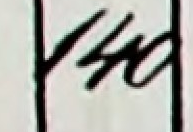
140
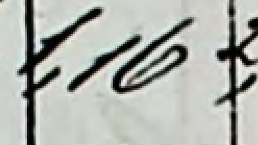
1,16
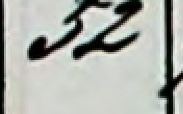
52
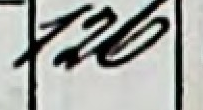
126
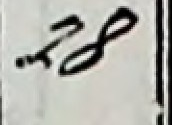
28
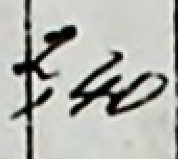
2,40
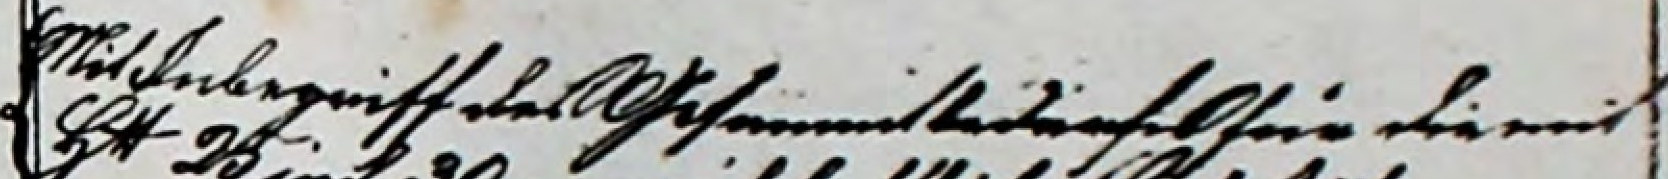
Mit Inbegriff des Gesammtbedürfes für die mit
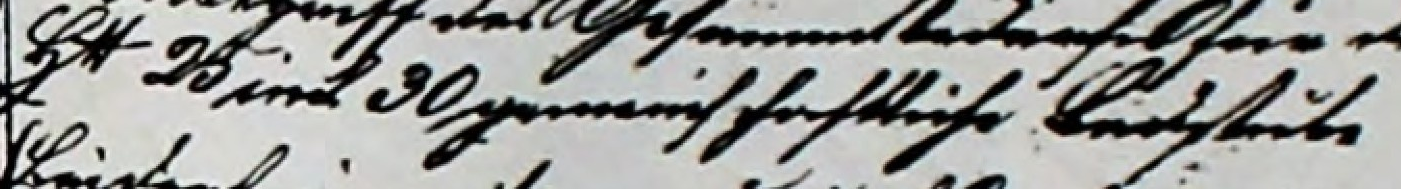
Htt 25 in L 30 gemeinfortliche Badstube
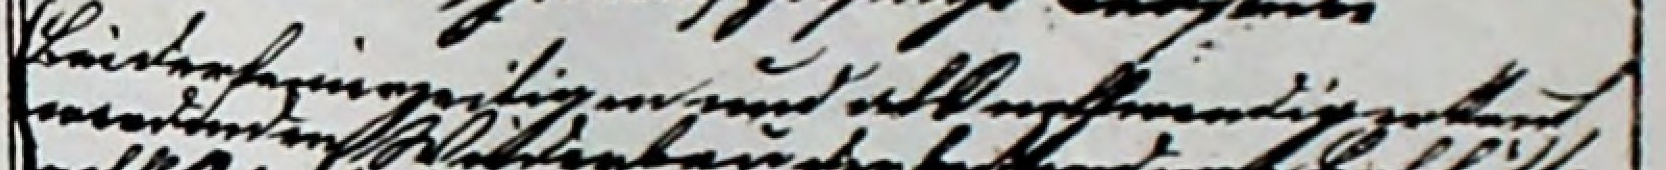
Bei der seiner zeitigen und als notwendiger kennt
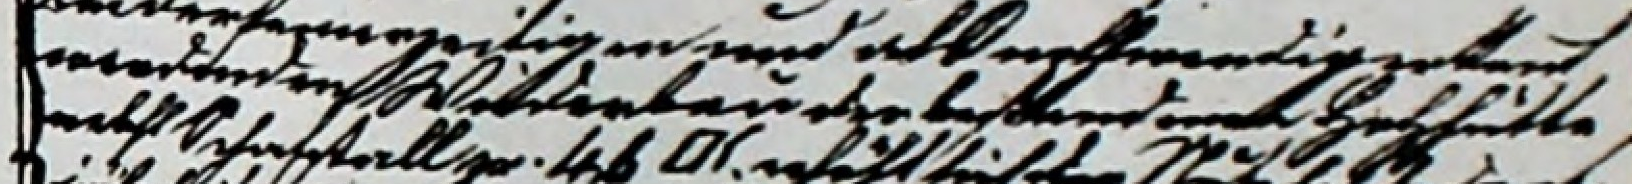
werdenden Wiederbau der bestandenen Holzhütte
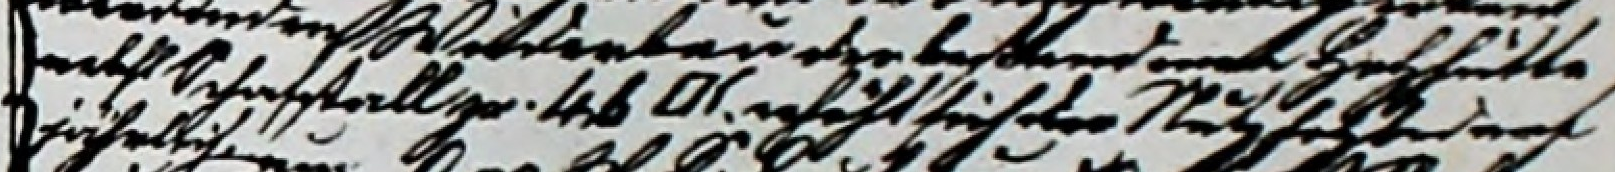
nebst Schafstall gr. 46 ??? erhält sich der Nutzbedarf
